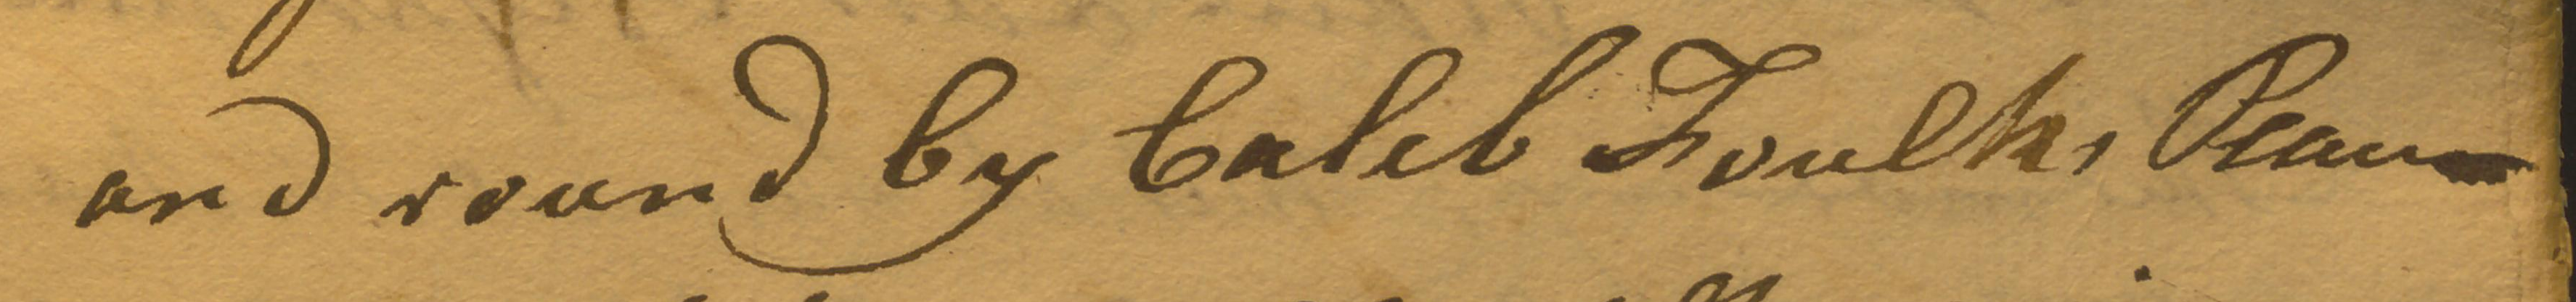and round by Caleb Foulks Plan
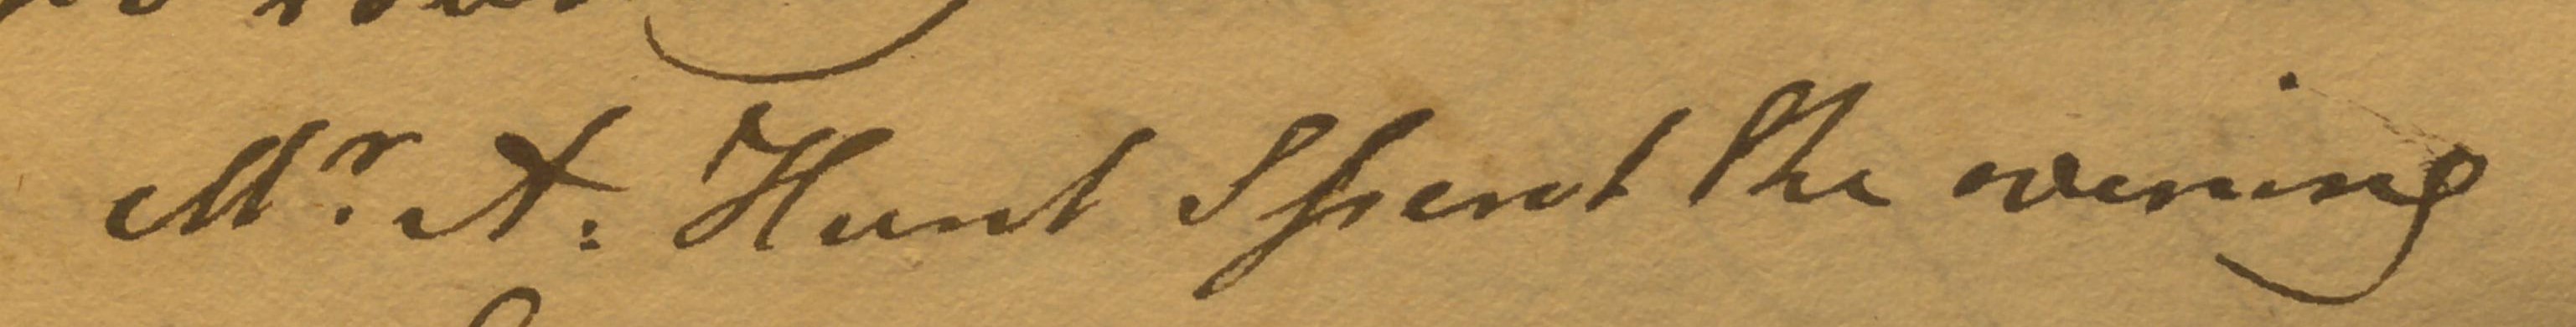M^r. A. Hunt Spent the evening
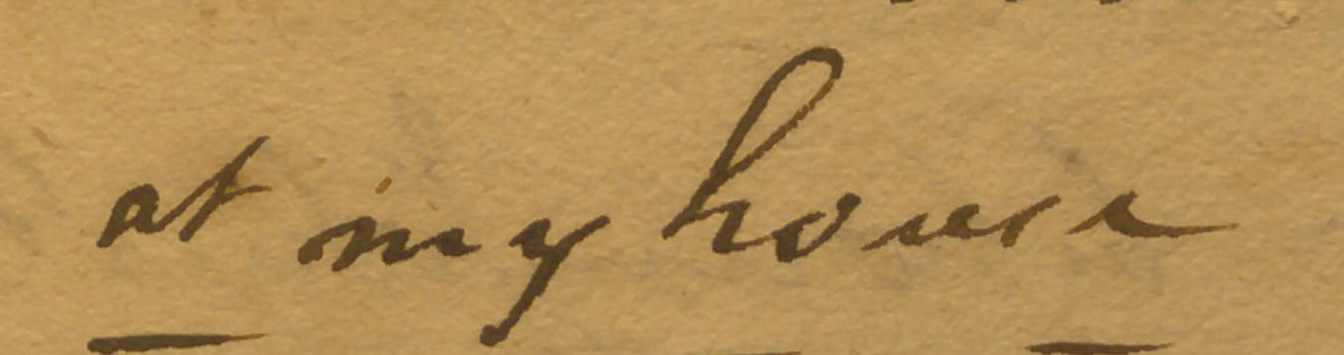at my house
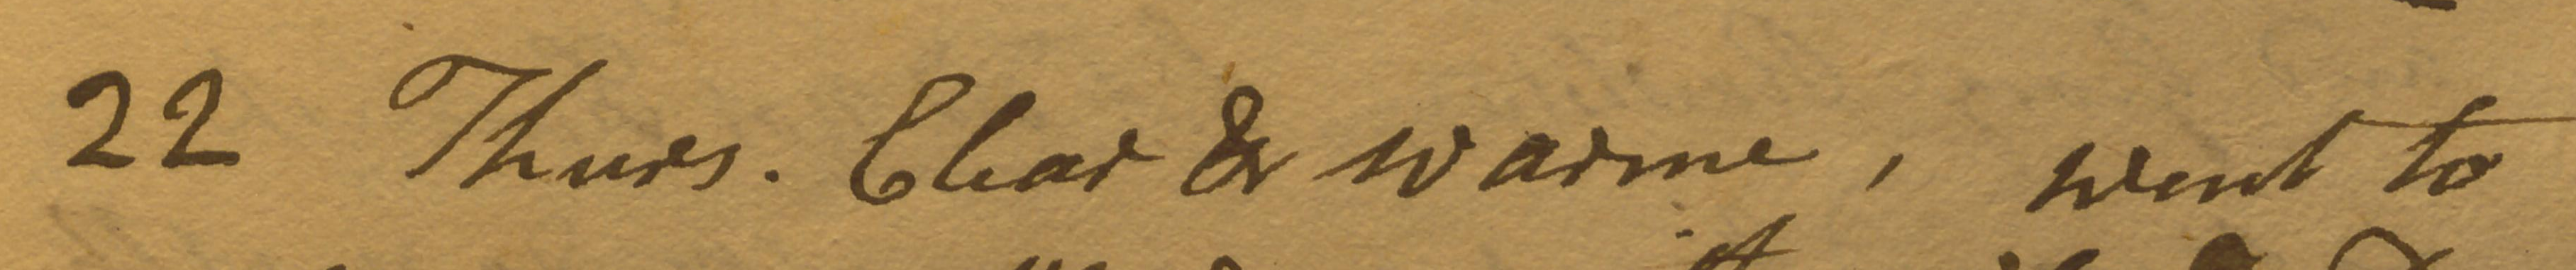22 Thurs. Clear & warme, went to
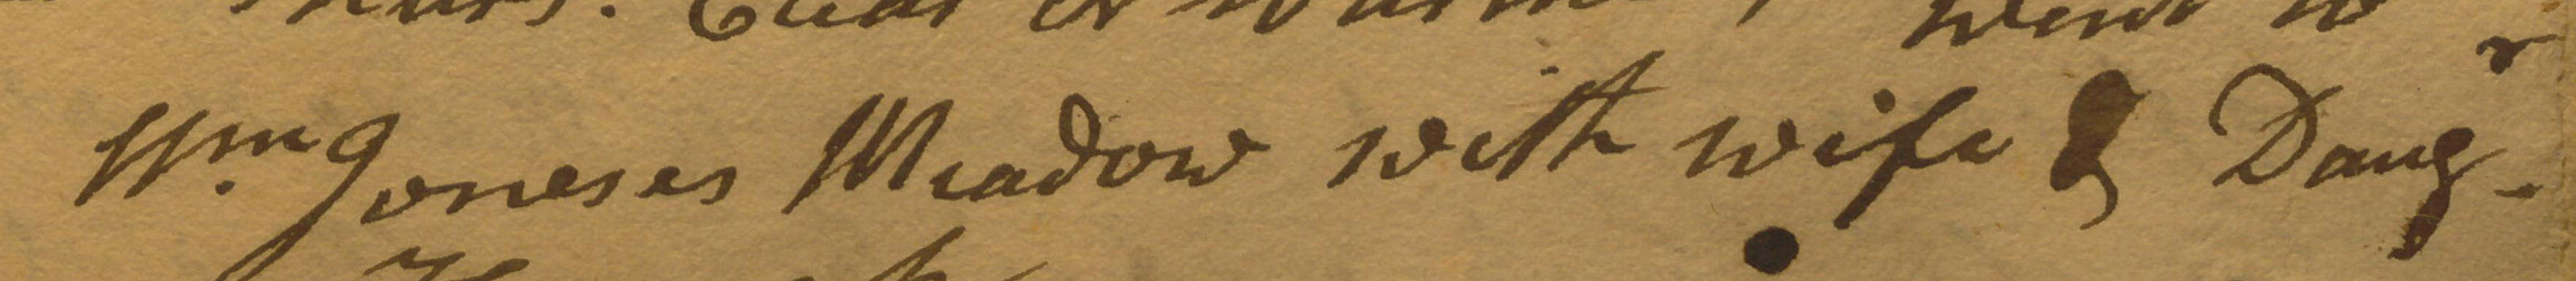W^m Joneses Meadow with wife & Daug^r.
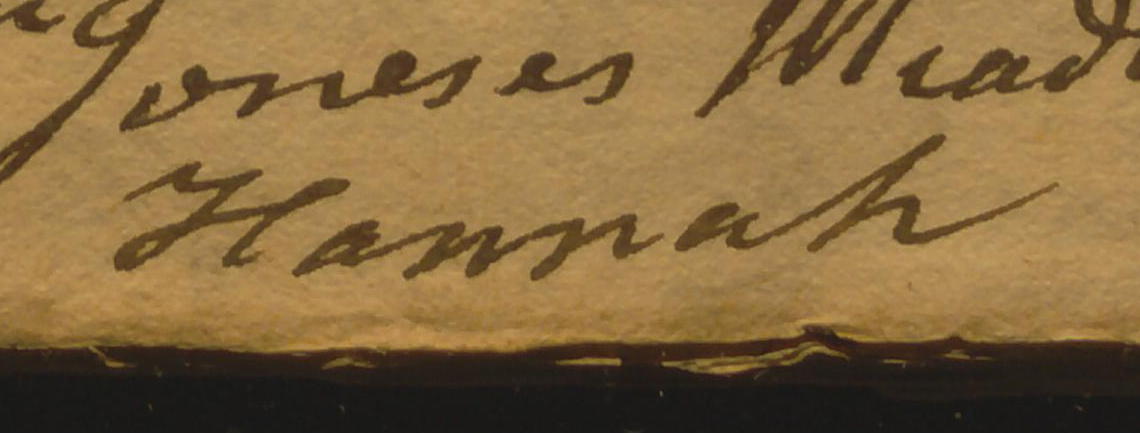Hannah
